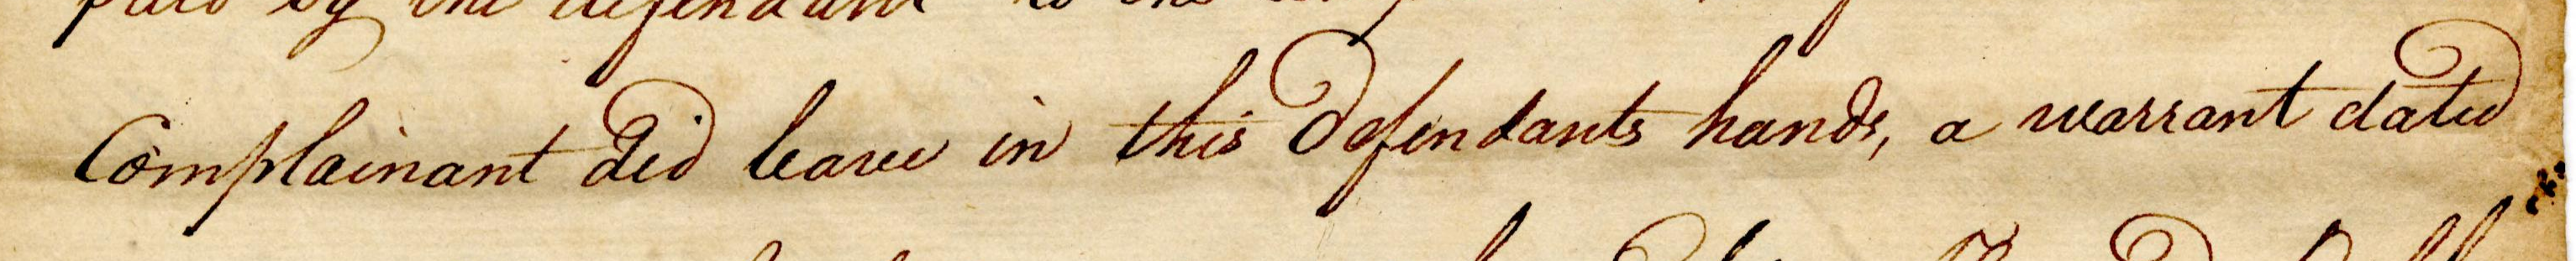Complainant did leave in this defendants hands, a warrant dated
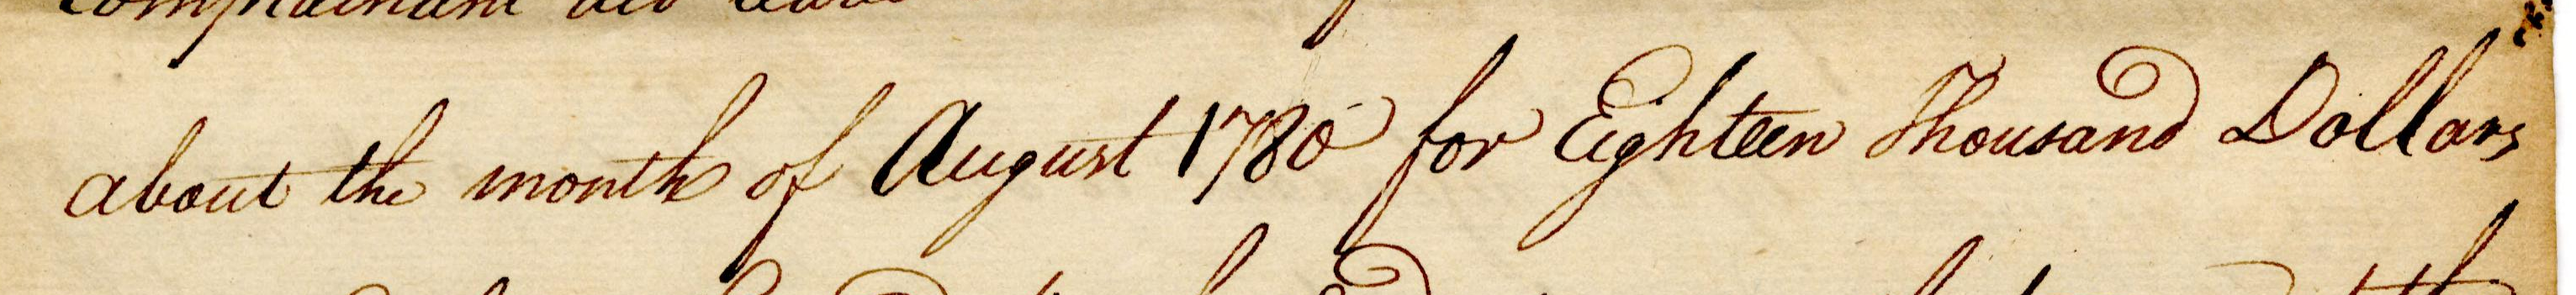about the month of August 1780 for Eighteen Thousand Dollars
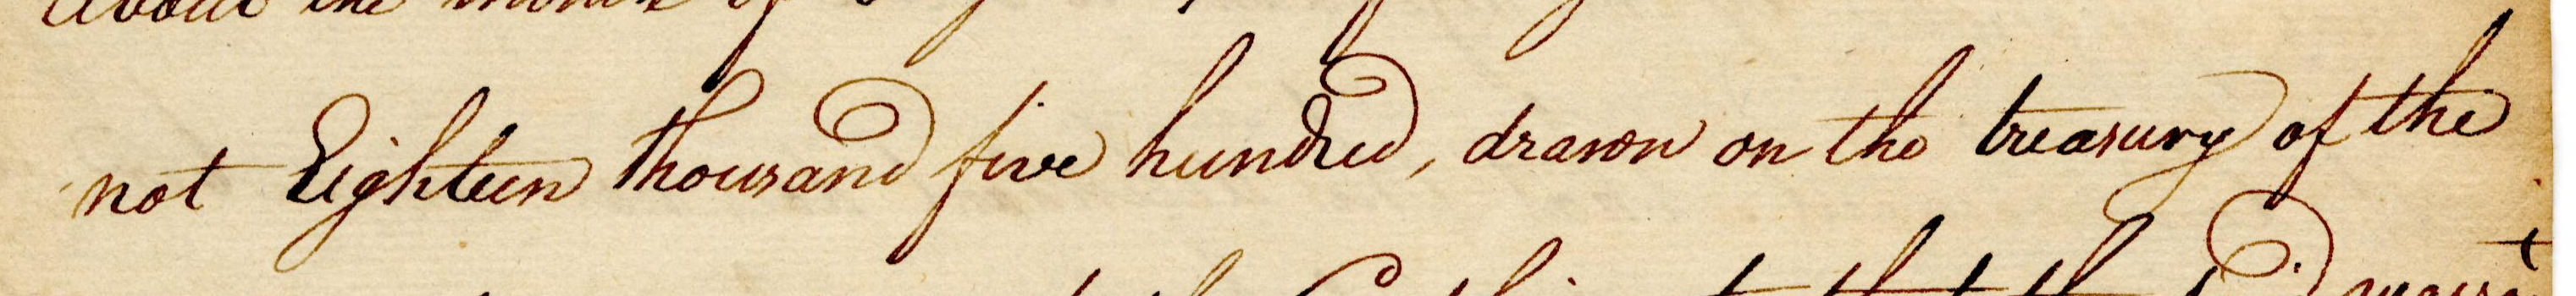not Eighteen thousand five hundred, drawn on the treasury of the
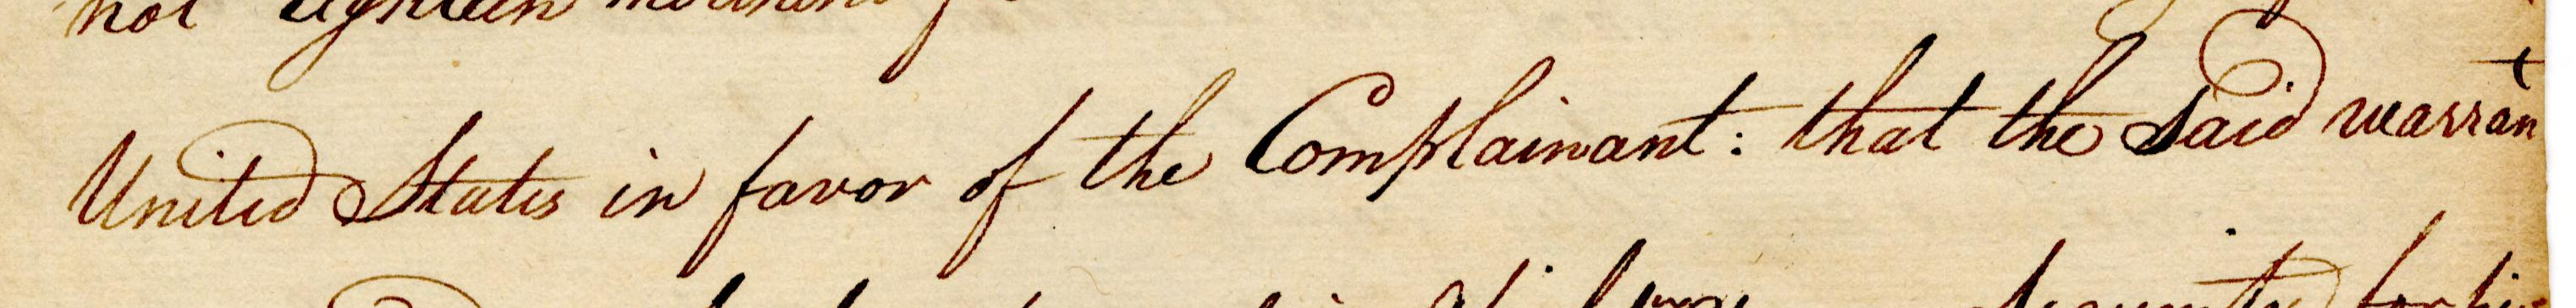United States in favor of the Complainant that the Said warran^t
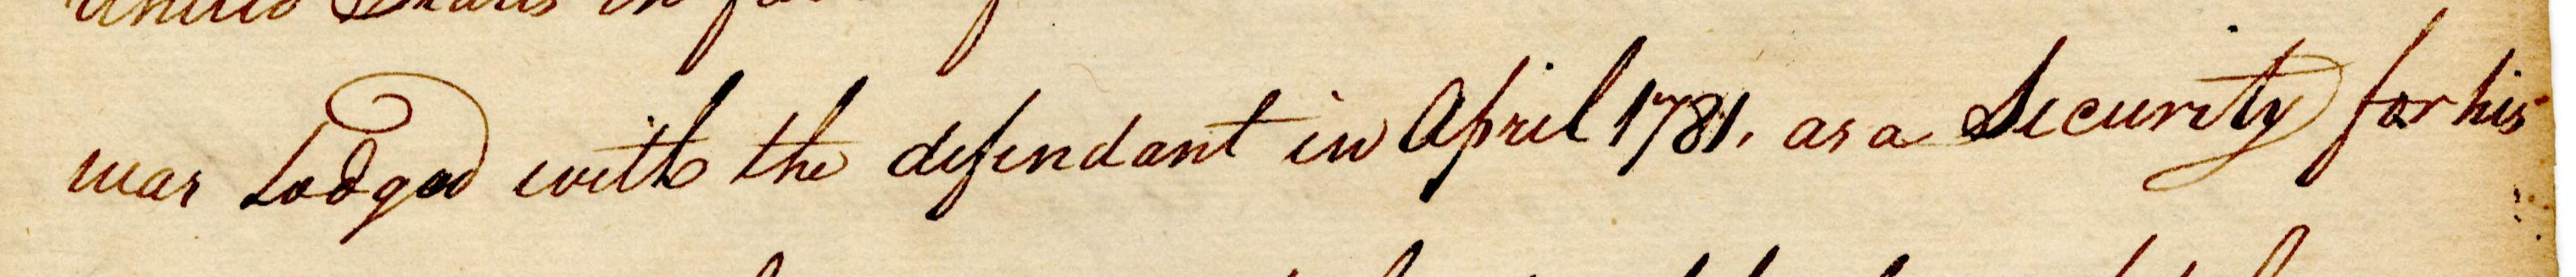was Lodged with the defendant in April 1781. as a security for his
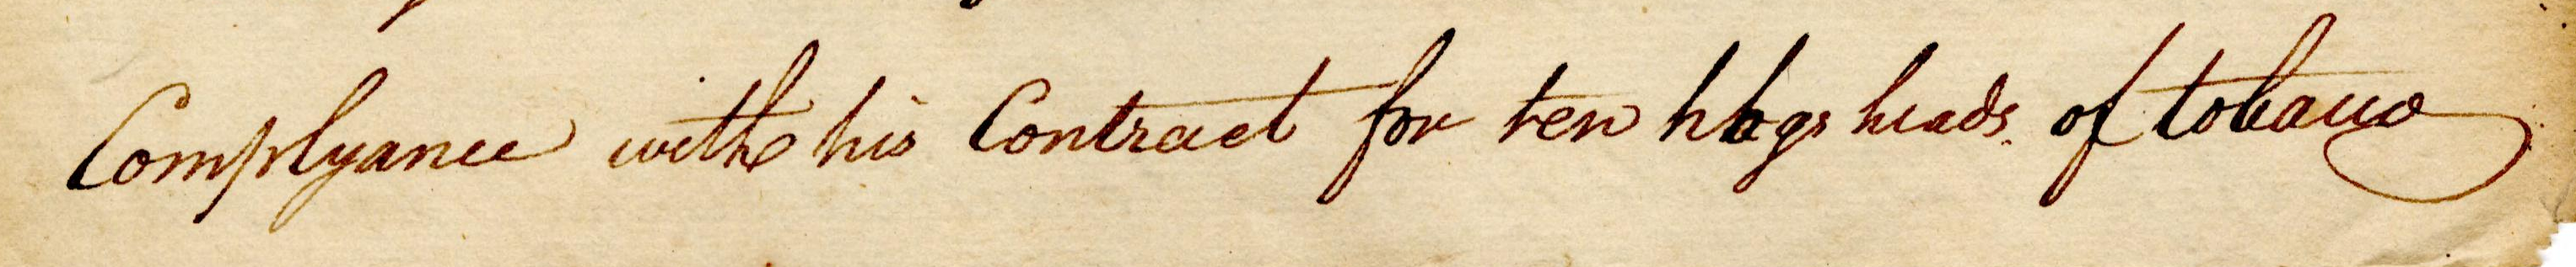Complyance with his Contract for ten hogheads of tobacco
